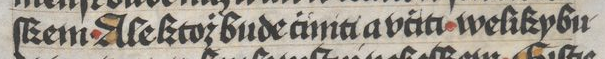ſkem.Ale ktoż bude ċiniti a vċiti.weliky bu¬
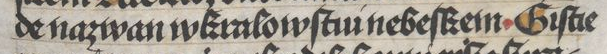de nazwan wkralovſtuí nebeſkem.Giſtie
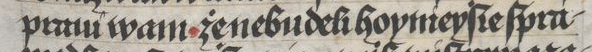praui wam.że nebudeli hoynieyẛíe ſpra¬
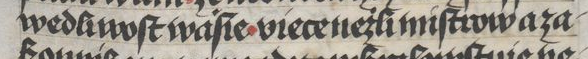wedliwoſt waẛie.víece neżli miſtrow a za¬
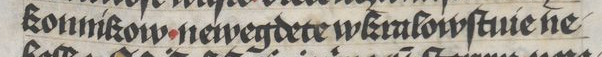konníkow.newegdete wkralowſtuie ne¬
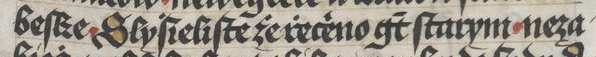beſke.Slyẛieli ſte ṙeċeno ḡt ſtarym.neza¬
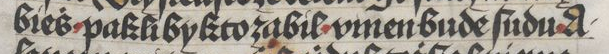bieṡ.pakli bykto zabil.vmen bude ſudu.A¬
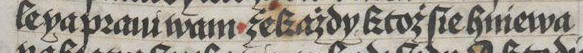le ya praui wam.żekażdy ktoż ſie hniewa
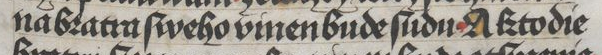na bratra ſweho vinen bude ſudu.A kto díe
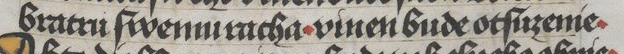bratru ſwemu racha.vinen bude otſuzeníe.
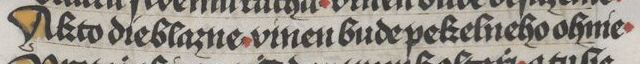Akto díe blazne.vinen bude pekelnelo ohníe.
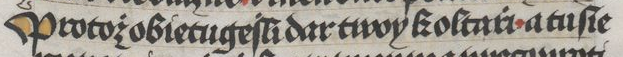Proto obietugeẛli dar twoy koltaṙi.a tuſie
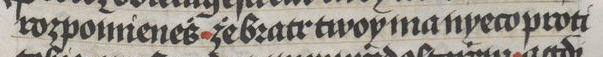rozpomieneṡ.že bratr twoy ma nyeco proti
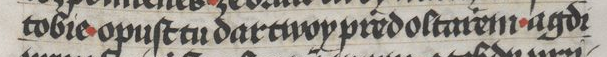tobie.opuſt tu dar twoy pṙed oltaṙem.a gdi
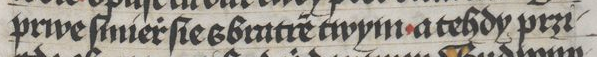prwe ſmieṙ ſie s bratrē twym.a trhdy przi¬
